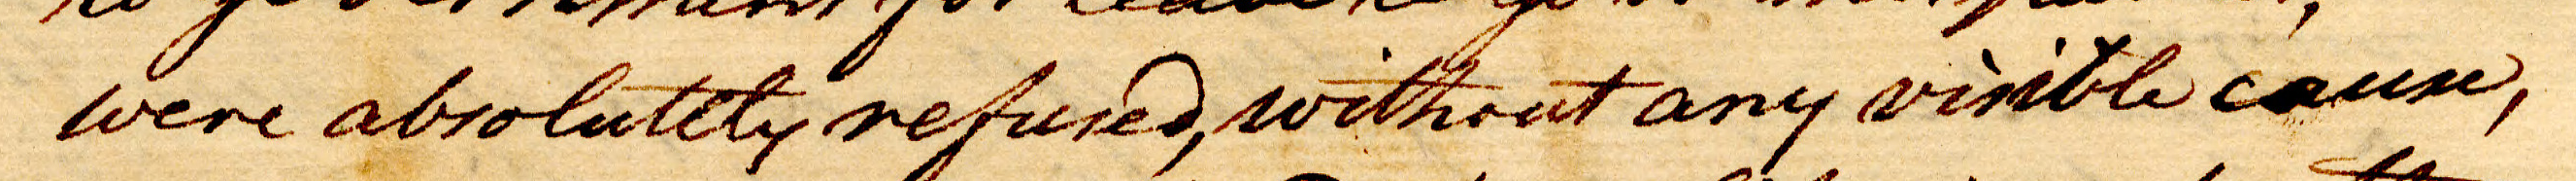were absolutely refused, without any visible cause,
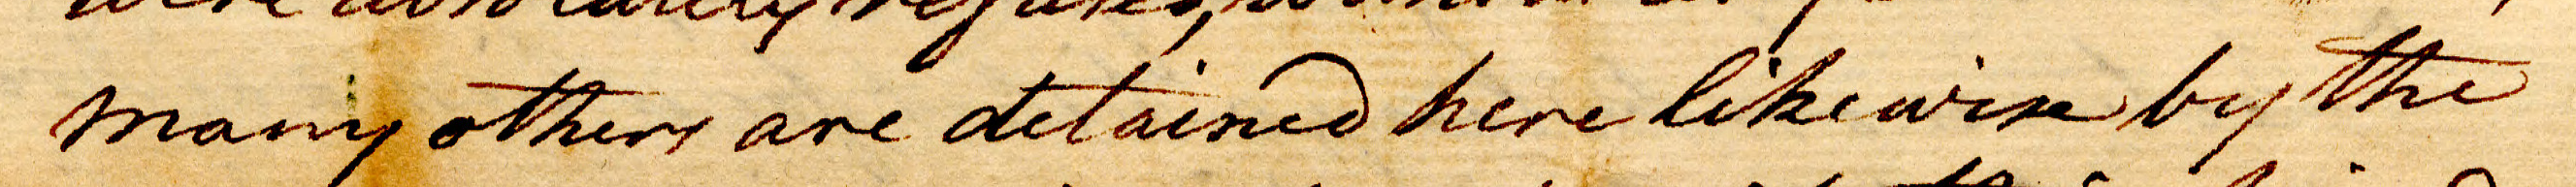many others are detained here likewise by the
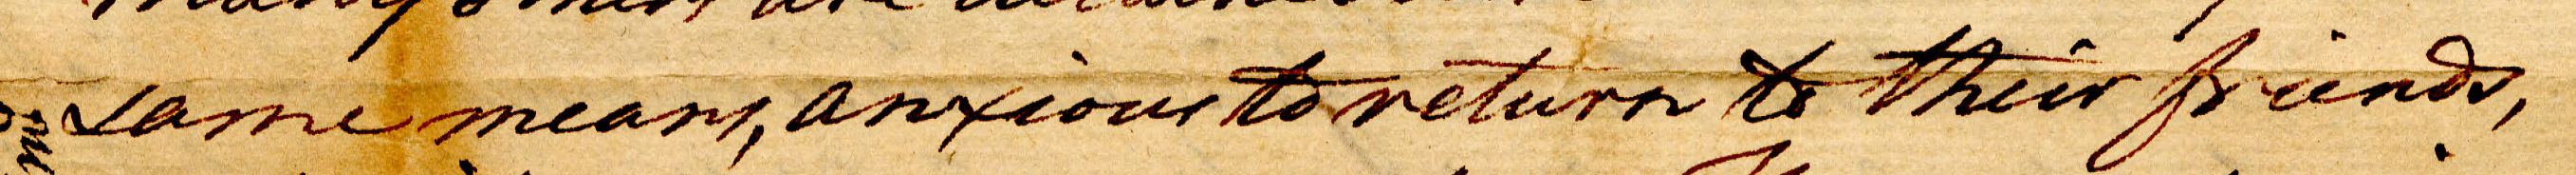same means, anxious to return to their friends,
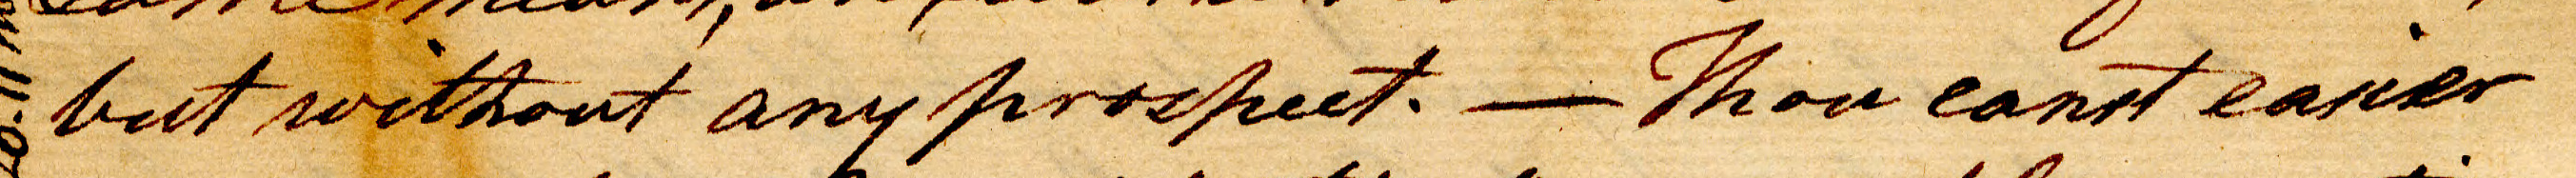but without any prospect.- Thou canst easier
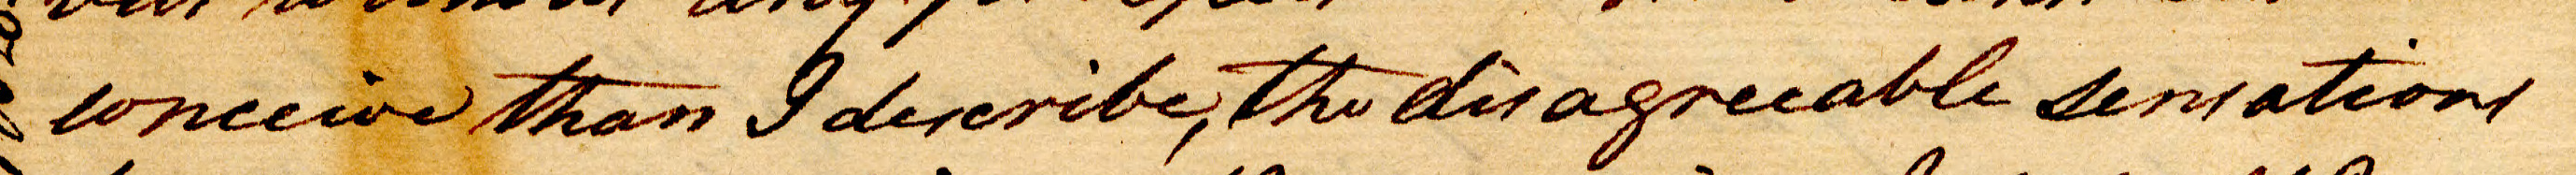conceive than I describe, the disagreeable sensations
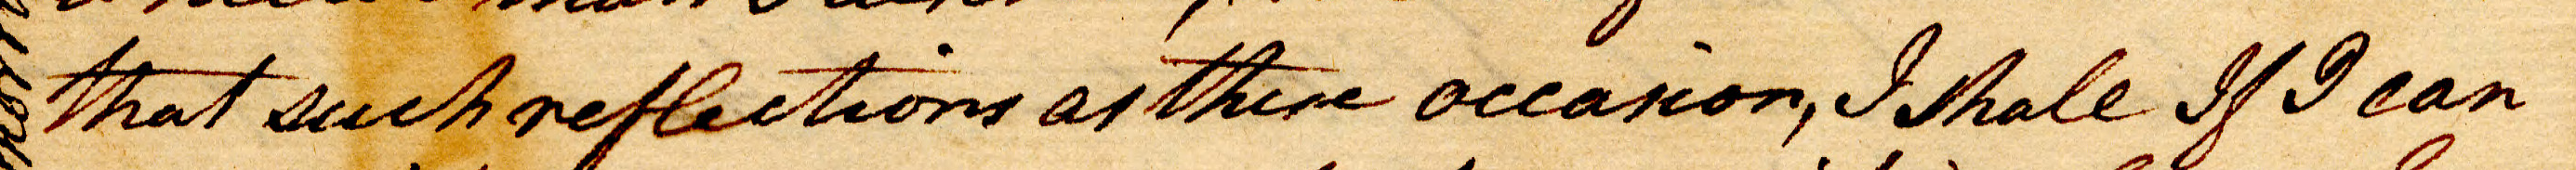that such reflections as these occasion, I shall If I can
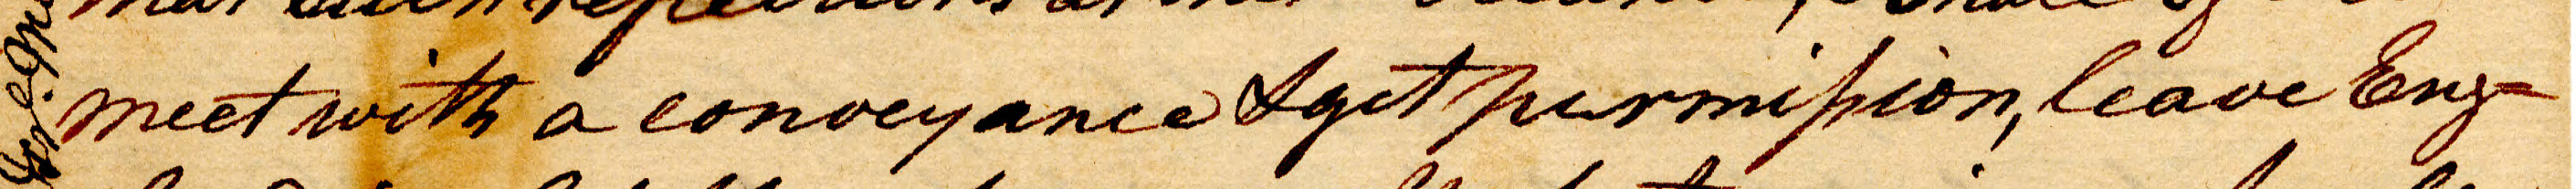meet with a conveyance & get permission, leave Eng-
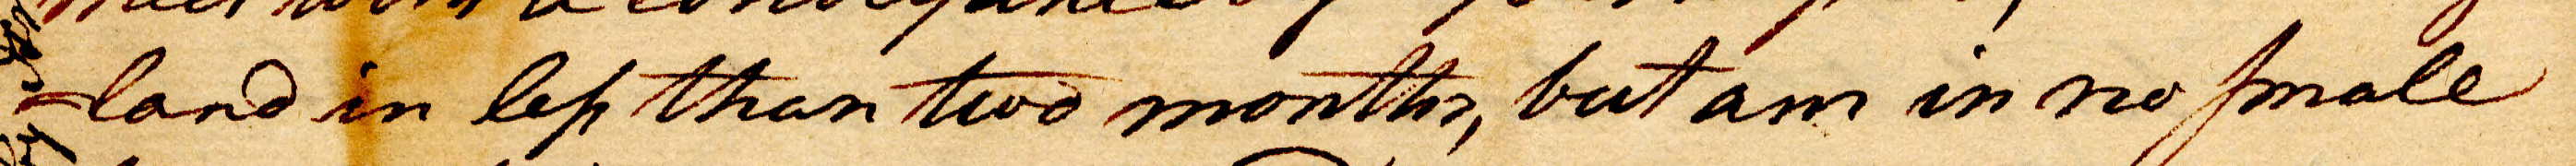-land in less than two months but am in no small
